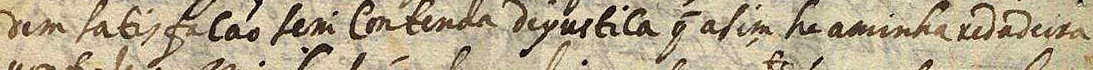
dem satisfaCaõ sem Contenda de yustica q̄ asim he a minha redadeira
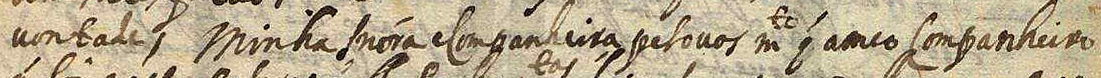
uontade, Minha snor̄a e Companheira pesouos mto q̄ a meo Companheiro
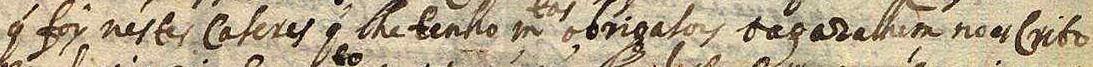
q̄ foy nestes Caseres q̄ lhe tenho mtas obrigasois o agazalhem no esCrito
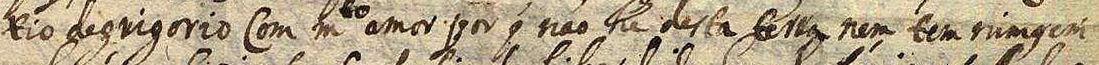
rio de grigorio Com mto amor porq̄ naõ he desta terra nem tem nimgem
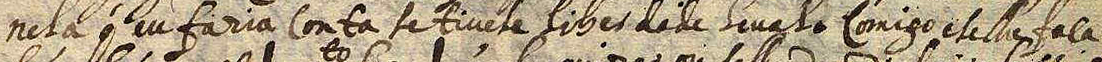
neLa q̄ eu fazia Conta se tiuese Liberdade LeuaLo Comigo e se lhe faCa
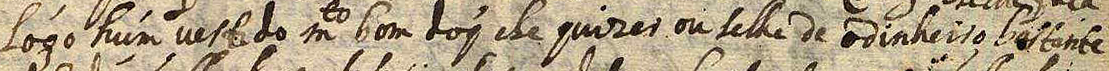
Logo hum uestido mto bom do q̄ eLe quizer ou selhe de o dinheiro bastante
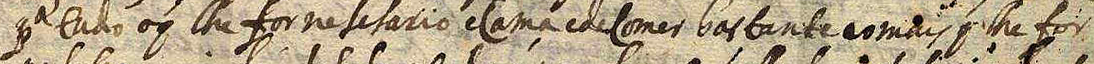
pa tudo o q̄ lhe for nesesario e Cama e de Comer bastante e o mais q̄ lhe for
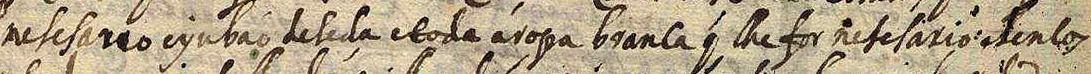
nesesario e yubaõ de seda, e toda a ropa branca q̄ lhe for nesesario e LenCos
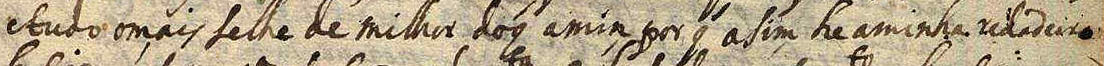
e tudo o mais se lhe de milhor do q̄ a min, porq̄ asim he a minha redadeira
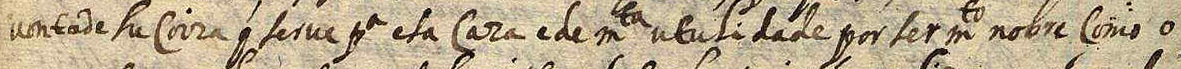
uontade he Coiza q̄ serue pa esa Caza e de mta utuLidade por ser mto nobre Como o
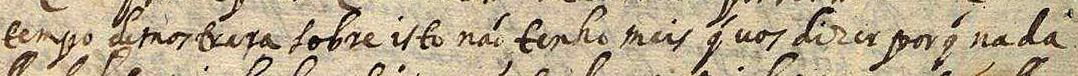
tempo demostrara sobre isto naõ tenho mais q̄ uos dizer porq̄ nada
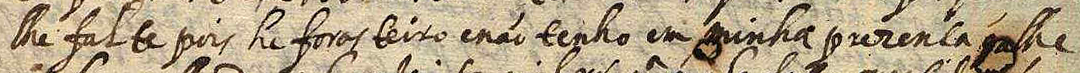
lhe faLte pois he forasteiro e naõ tenho em minha prezenCa _ lhe
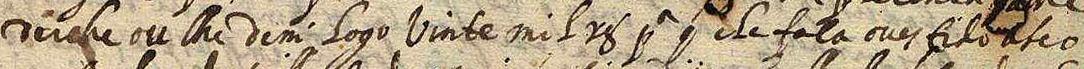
deiche ou lhe dem Logo Vinte miL rs̄ pa q̄ eLe faCa o uestido a seo
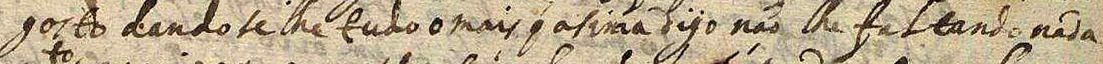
gosto dandoselhe tudo o mais q̄ asima digo naõ lhe faLtando nada
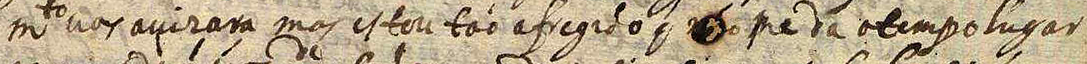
mto uos auizara mas estou taõ afregido q̄ _ me da o tempo Lugar
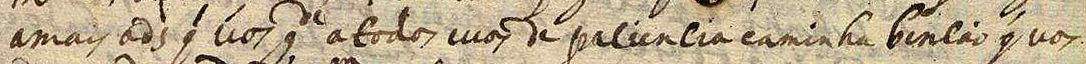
a mais a ds̄ q̄ uos gde a todos e uos de paCienCia e a minha benCaõ q̄ uos
